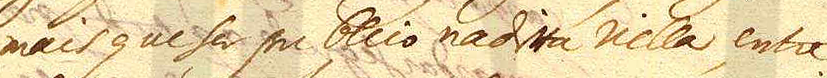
mais que ser publico na ditta uilla, entre
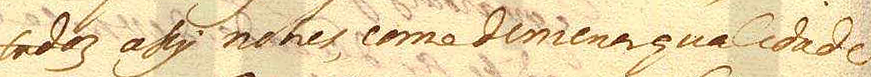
todoz assy nobres, como de menos qualidade
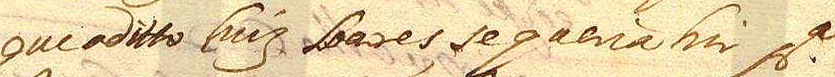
que o ditto luiz soares, se queria hir p.a
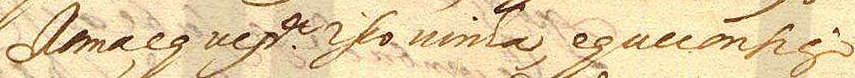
Roma, e que pa isso uinha, e que consigo
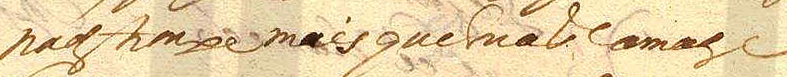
naõ trouxe mais que huas̄ camas e
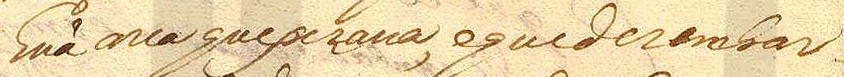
huā arca que pezaua, e que dezembar
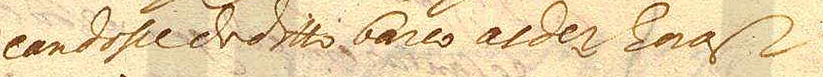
candosse do ditto barco as dez horas
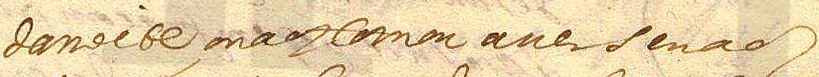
da noite, o naõ tornou a uer senaõ
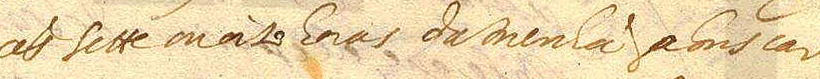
as sette ou oito horas da menhã a buscar
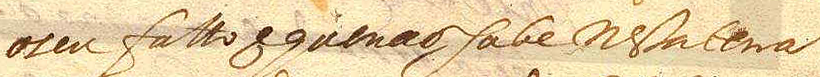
o seu fatto e que naõ sabe nesta terra
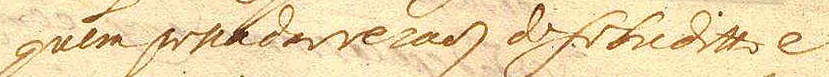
quem possa dar rezaõ do sobreditto, e
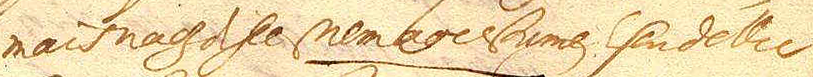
mais naõ disse nem ao costume E sendolhe
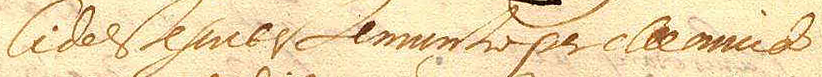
lido este seu testemunho por elle ouuido
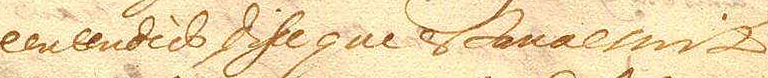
e entendido, disse que estaua escrito
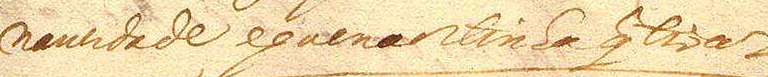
na uerdade, e que naõ tinha q̄ tirar
